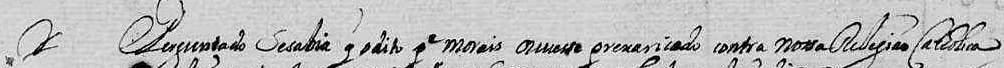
item E Perguntado Se sabia q̄ o dito pe morais ouuesse preuaricado contra nossa Religiaõ Catholica
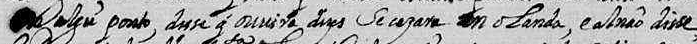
a algū ponto, disse q̄ ouuira dizer se cazara en olanda, e al naõ disse
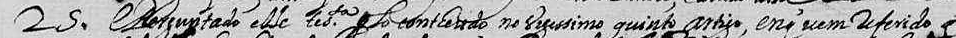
25. E Perguntado elle testa plo contheudo no Vigessimo quinto artigo, en q̄ uem Referido q̄
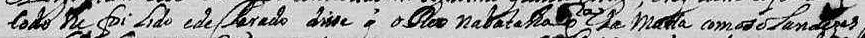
todo lhe foi lido e deClarado, disse q̄ o Reo na batalha p.ra da matta com os olandezes
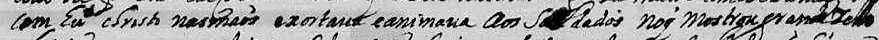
com hū christo nas maõs exortaua e animaua aos soldados no q̄ mostrou grande zello
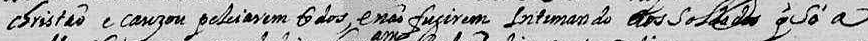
christaõ e cauzou peleiarem todos, e naõ fugirem Intimando aos soldados q̄ só a
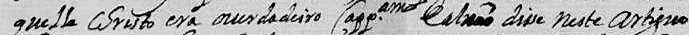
quelle Christo era o uerdadeiro Capp.am E al naõ disse neste artiguo
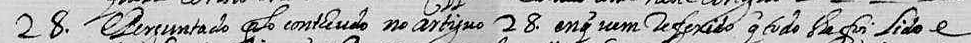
28. E Perguntado p̄lo contheudo no artiguo 28. en q̄ uem Referido q̄ todo lhe foi lido e
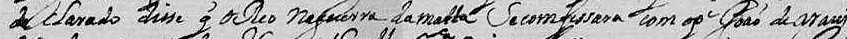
declarado disse q̄ o Reo na guerra da matta Se comfessara com o pe Joaõ de araujo
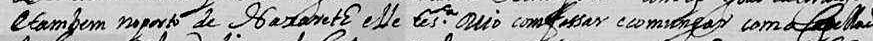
e tambem no porto de Nazareth elle tes.ta o uio comfessar e comungar com o Capellaõ
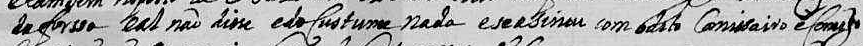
da forssa e al não disse e do Custume nada e se asinou com o dito Comissairo e Comigo
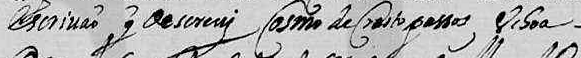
Escriuaõ q̄ o escreuj Cosmo de Crasto passos Vchoa
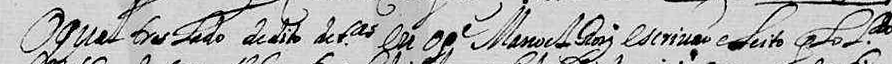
O qual traslado de dito de t.as eu o pe Manoel Roiz escriuaõ eLeito p̄Lo L.do
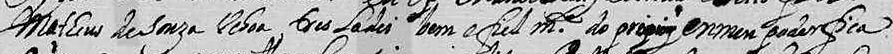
Matheus de souza Vchoa tresladei bem e fielm.te do propio en meu poder fica
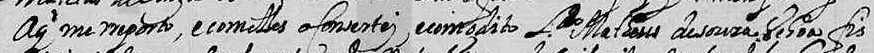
a q̄ me rreporto, e com elles o Consertei, e com o dito L.do Matheus de souza Vchoa fis
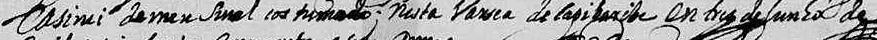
E asinei de meu sinal costumado; nesta Varsea de capibaribe en tres de Junho de
